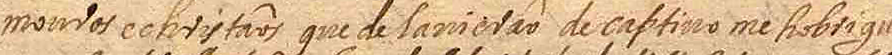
mouros e christaõs que de la uieraõ de captiuo me hobrigu
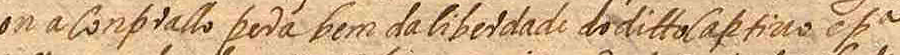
ou a Conprallo pera bem da liberdade do ditto Captiuo e pa
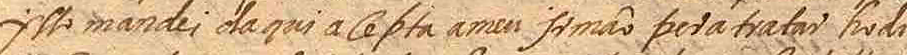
ysso mandei daqui a Cepta a meu jrmão pera tratar ho di
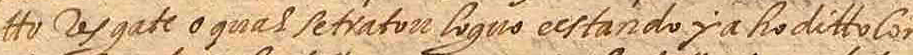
tto resgate o qual se tratou loguo e estando ya ho ditto Cor
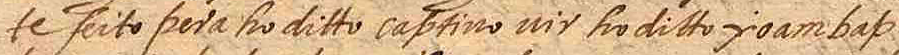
te feito pera ho ditto captiuo uir ho ditto yoam bap
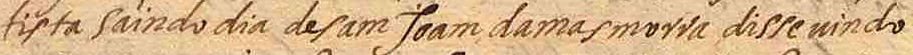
tista saindo dia de sam Joam da masmorra disse uindo
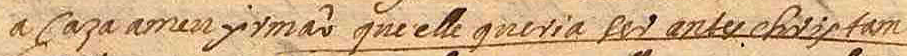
a Caza a meu yrmaõ que elle queria ser antes christam
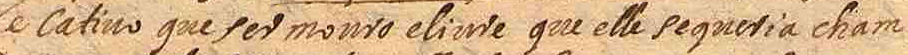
e catiuo que ser mouro e liure que elle se queria cham
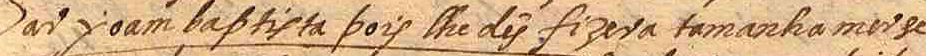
ar yoam baptista pois lhe des̄ fizera tamanha merse
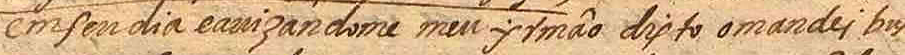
em seu dia e auizandome meu yrmão disto o mandei bus
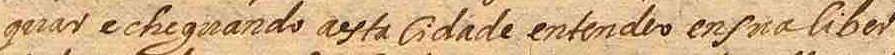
quar e cheguando a esta Cidade entendeo en sua liber
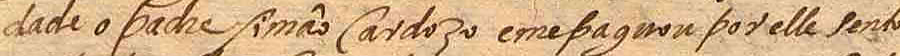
dade o padre simão Cardozo e me paguou por elle sento
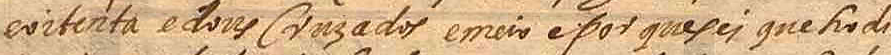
e oitenta e dous Cruzados e meio e porque sei que ho di
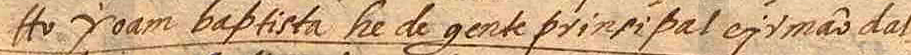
tto Yoam baptista he de gente prinsipal e yrmão dal
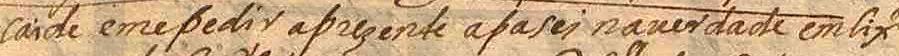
caide e me pedir a prezente e pasei na uerdade em lixa
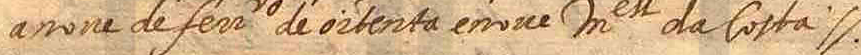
a noue de feuro de oitenta e noue Mell da Costa. //
